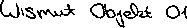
Wismut Objekt 01
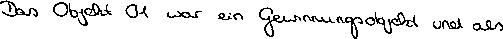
Das Objekt 01 war ein Gewinnungsobjekt und als
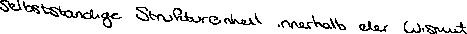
selbständige Struktureinheit innerhalb der Wismut
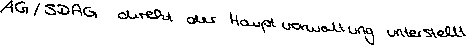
AG/SDAG direkt der Hauptverwaltung unterstellt
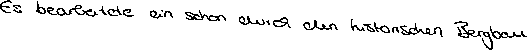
Es bearbeitete ein schon durch den historischen Bergbau
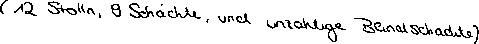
(12 Stolln, 9 Schächte, und unzählige Blindschächte)
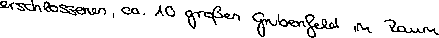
erschlossenes, ca. 10 großes Grubenfeld im Raum
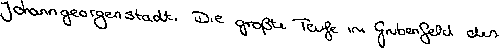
Johanngeorgenstadt. Die größte Teufe im Grubenfeld des
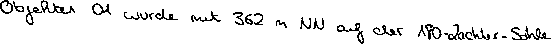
Objektes 01 wurde mit 362 m NN auf der 180-Lachter-Sohle
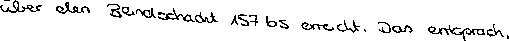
über den Blindschacht 157bis erreicht. Das entsprach,
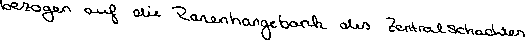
bezogen auf die Rasenhängebank des Zentralschachtes
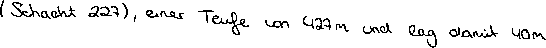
(Schacht 227), einer Teufe von 427 m und lag damit 40 m
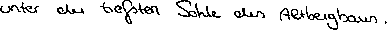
unter der tiefsten Sohle des Altbergbaus.
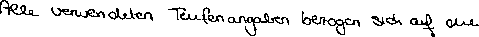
Alle verwendeten Teufenangaben bezogen sich auf
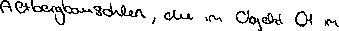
Altbergbausohlen, die im Objekt 01 im
